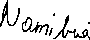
Namibia
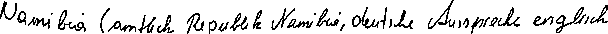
Namibia (amtlich Republik Namibia; deutsche Aussprache englisch
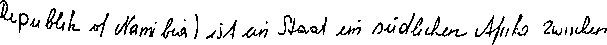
Republic of Namibia) ist ein Staat im südlichen Afrika zwischen
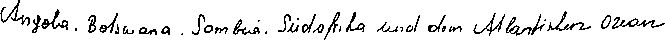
Angola, Botswana, Sambia, Südafrika und dem Atlantischen Ozean.
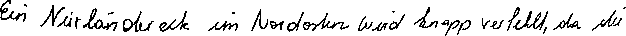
Ein Vierländereck im Nordosten wird knapp verfehlt, da die
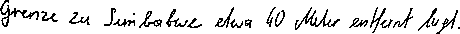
Grenze zu Simbabwe etwa 40 Meter entfernt liegt.
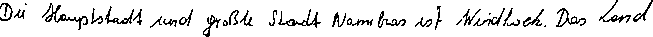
Die Hauptstadt und größte Stadt Namibias ist Windhoek. Das Land
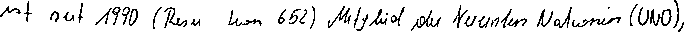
ist seit 1990 (Resolution 652) Mitglied der Vereinten Nationen (UNO),
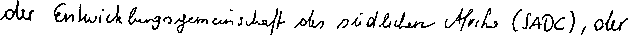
der Entwicklungsgemeinschaft des südlichen Afrika (SADC), der
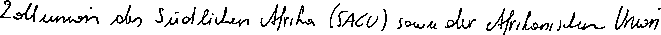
Zollunion des Südlichen Afrika (SACU) sowie der Afrikanischen Union
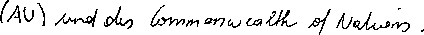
(AU) und des Commonwealth of Nations.
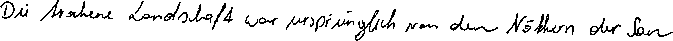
Die trockene Landschaft war ursprünglich von den Völkern der San
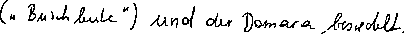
("Buschleute") und der Damara besiedelt.
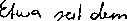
Etwa seit dem
